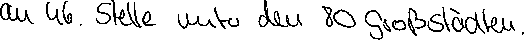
an 46. Stelle unter den 80 Großstädten
